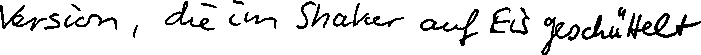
Version, die im Shaker auf Eis geschüttelt
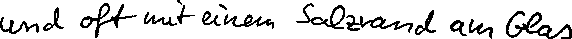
und oft mit einem Salzrand am Glas
